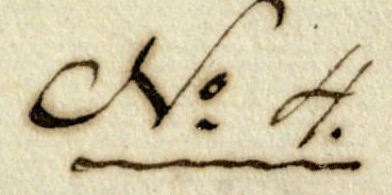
Nº 4.
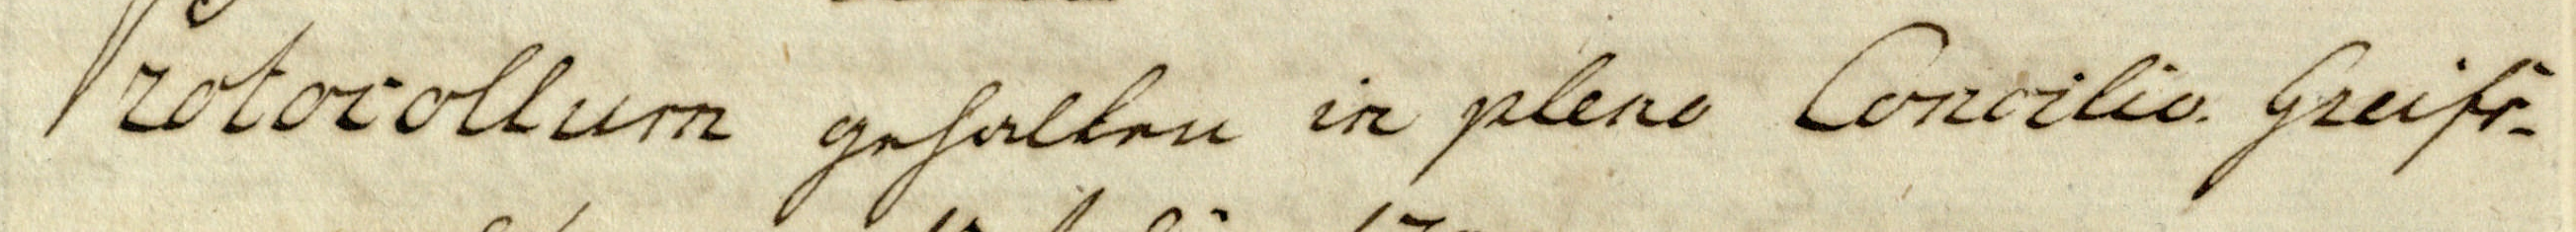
Protocollum gehalten in pleno Concilio Greifs¬
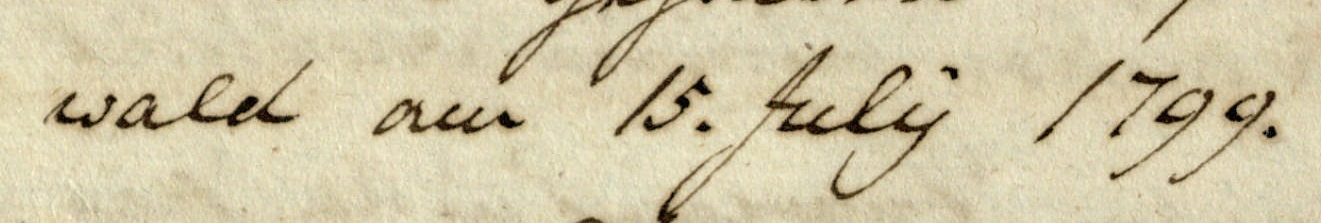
wald am 15. Julÿ 1799.
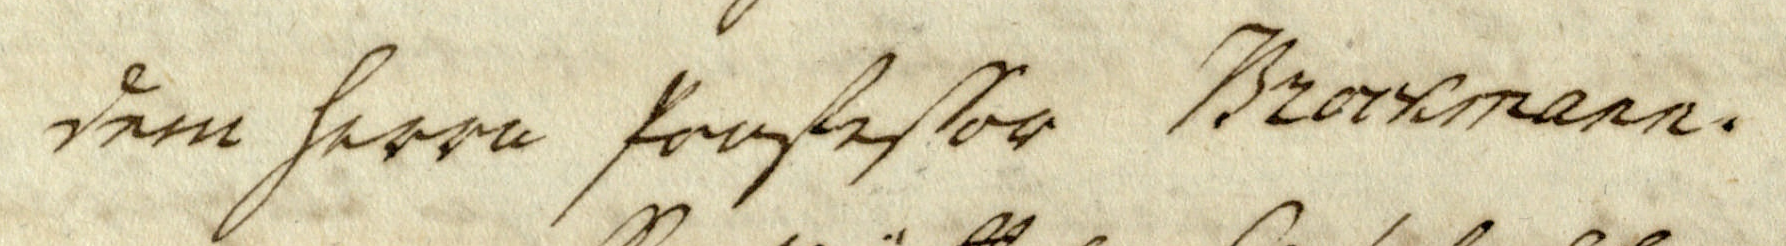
dem herrn Professor Brockmann.
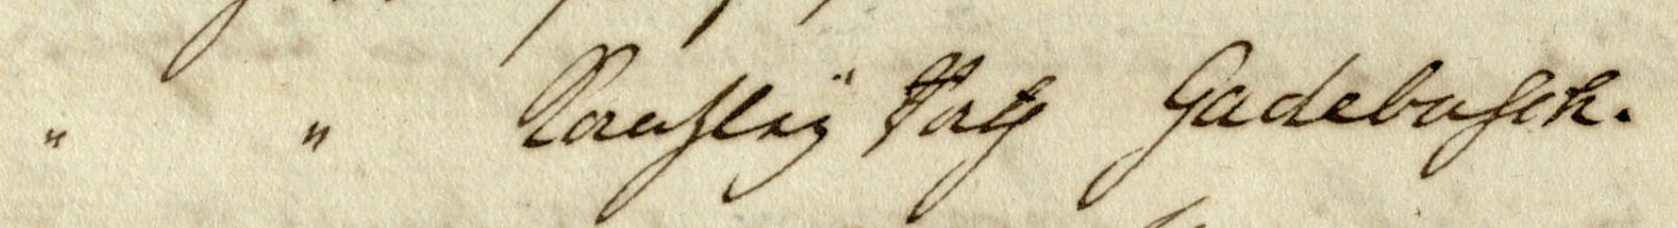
Kanzleÿ Rath Gadebusch.
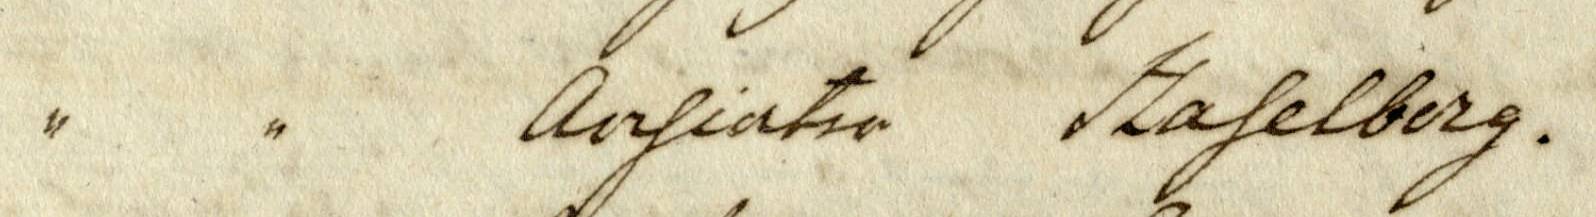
Archiater Haselberg.
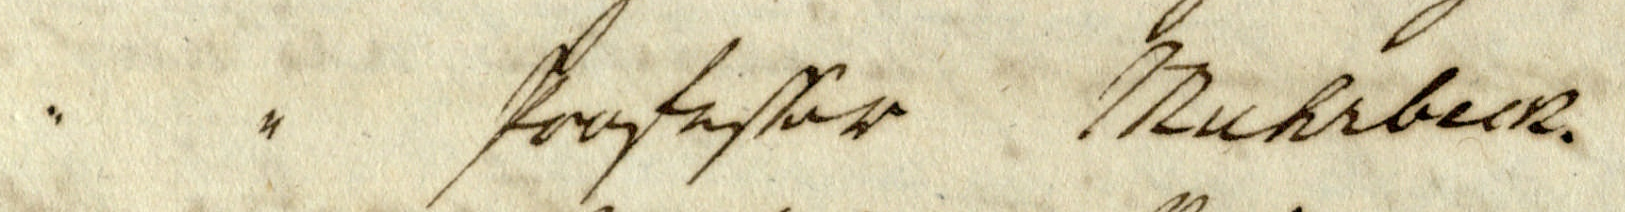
Professor Muhrbeck.
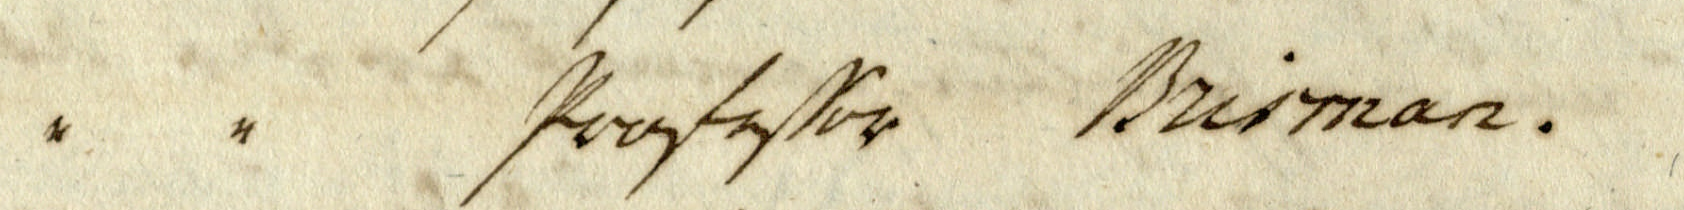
Professor Brisman.
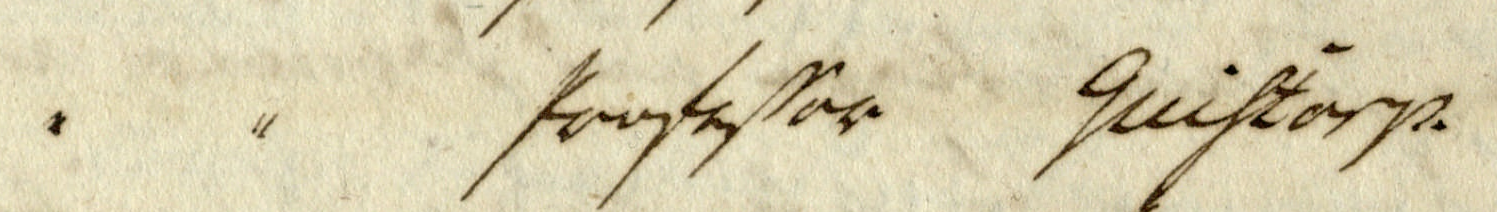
Professor Quistorp.
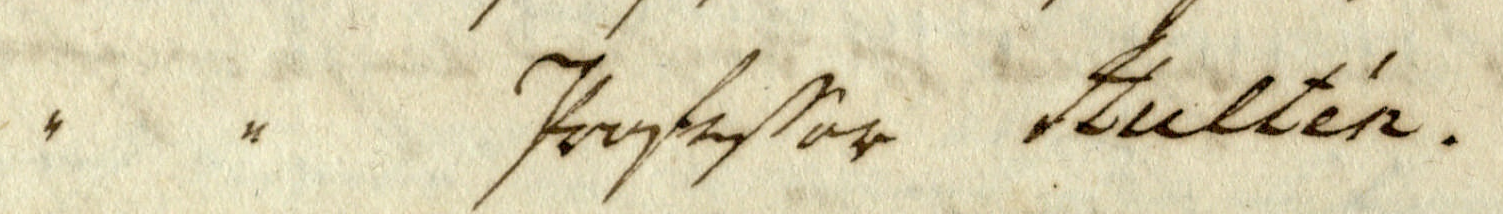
Professor Hultèn.
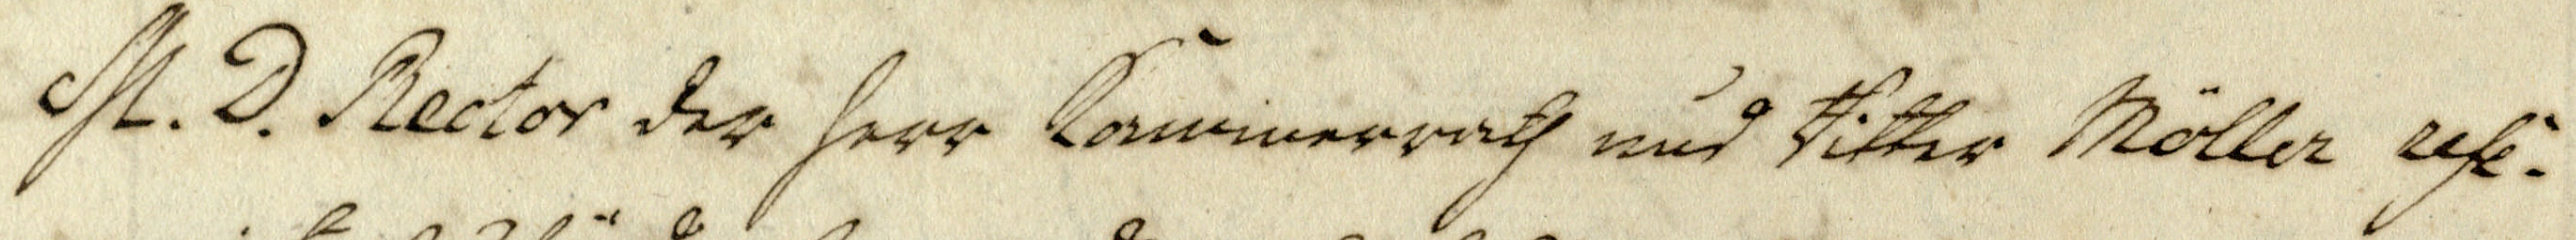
M. D. Rector der herr Kammerrath und Ritter Möller refe¬
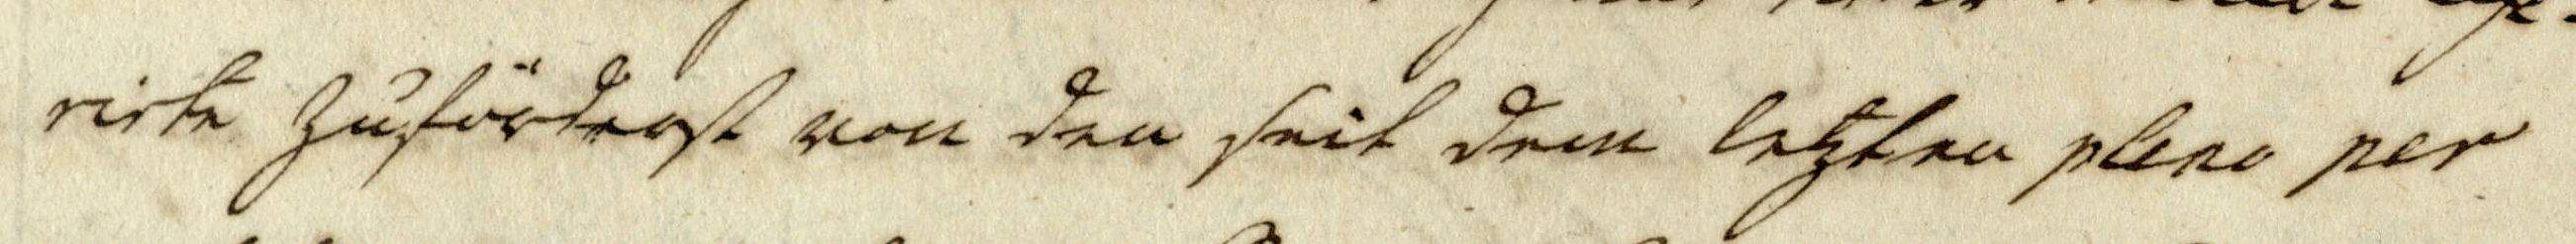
riete zuförderst von den seit dem letzten pleno per
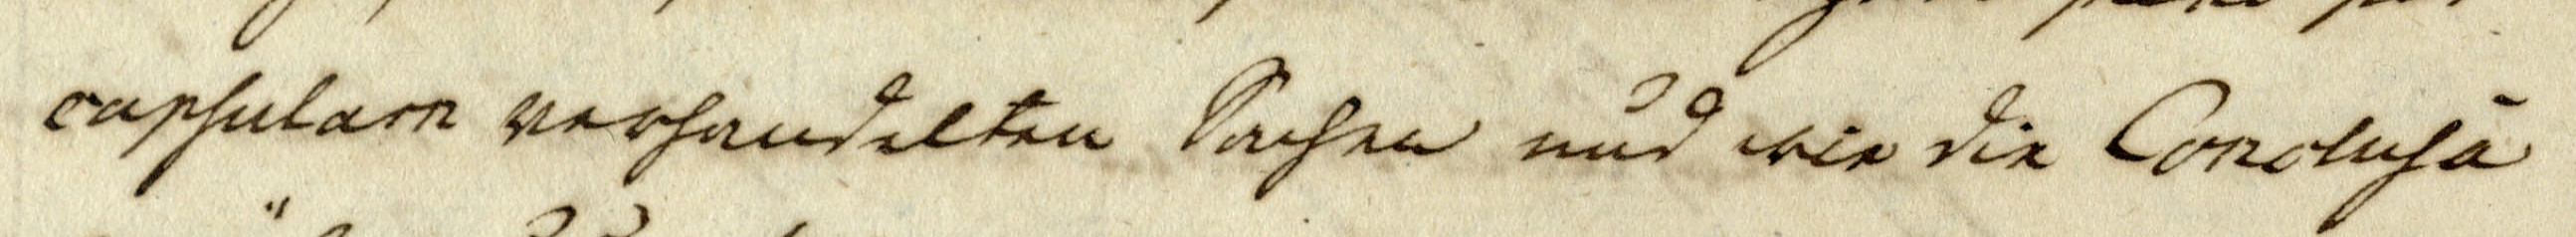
capsulam verhandelten Sachen und wie die Conclusa
